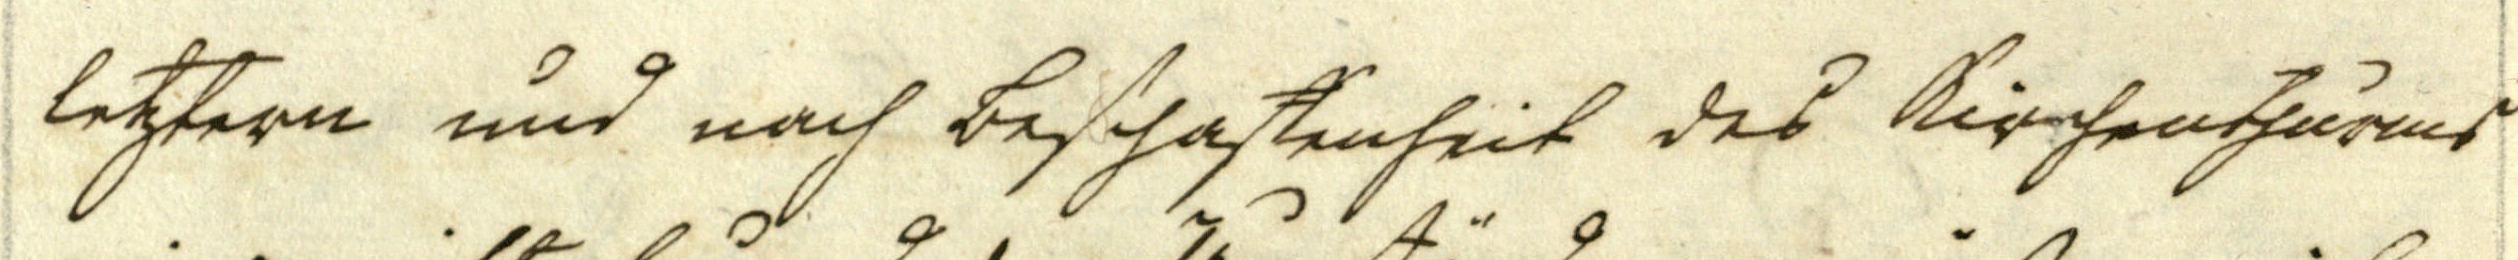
letztern und nach Beschaffenheit des Kirchenthurms
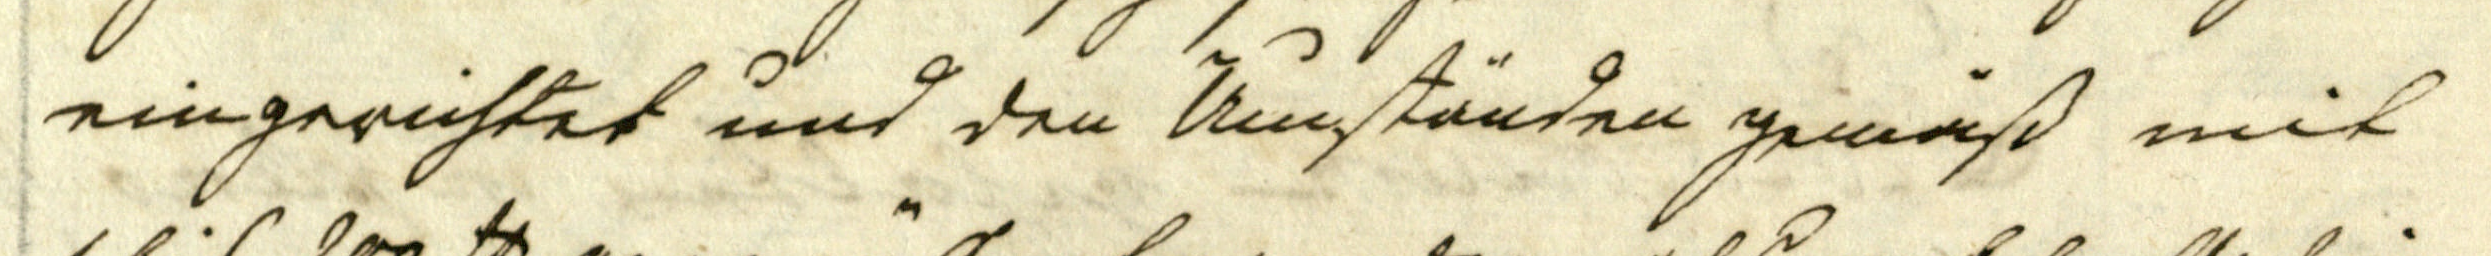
eingerichtet und den Umständen gemäß mit
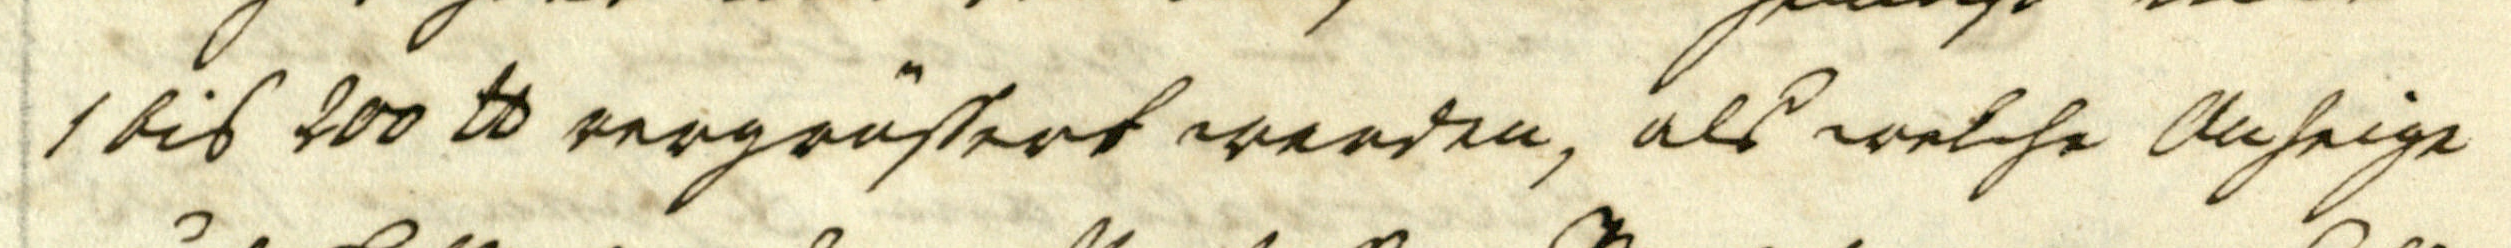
1 bis 200 tt vergrössert werden, als welche Anzeige
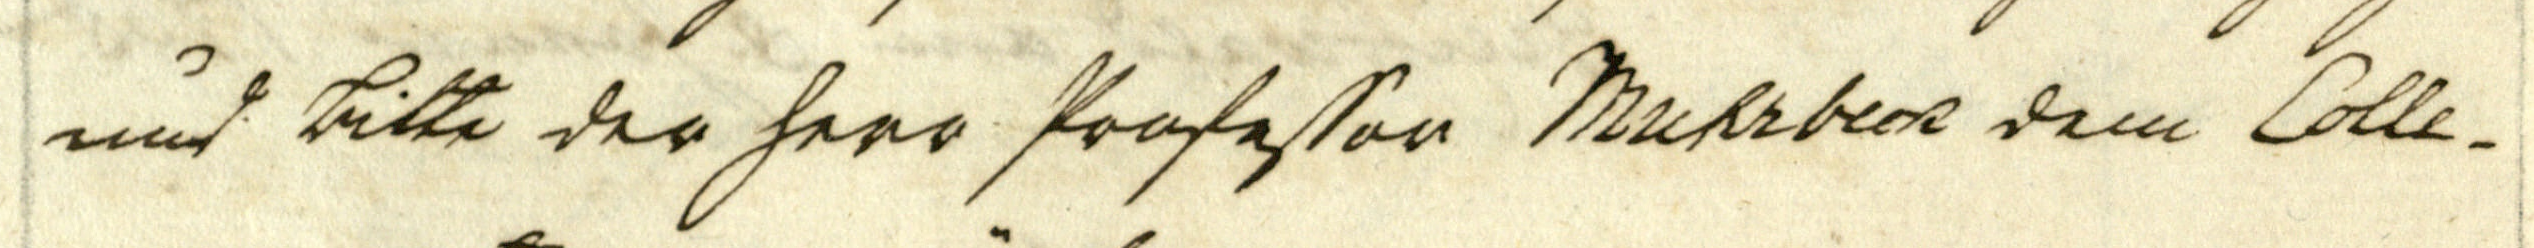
und Bitte der Herr Professor Muhrbeck dem Colle¬
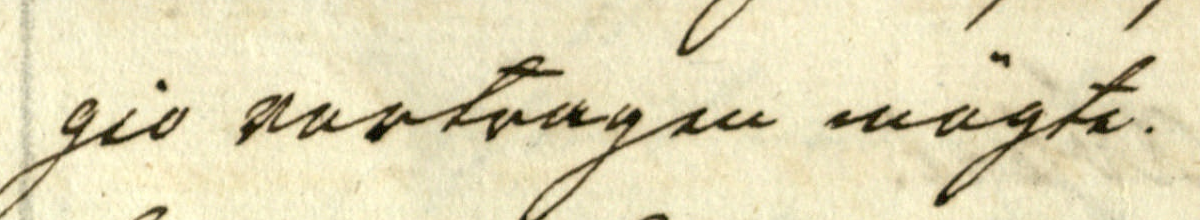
gio vortragen mögte.
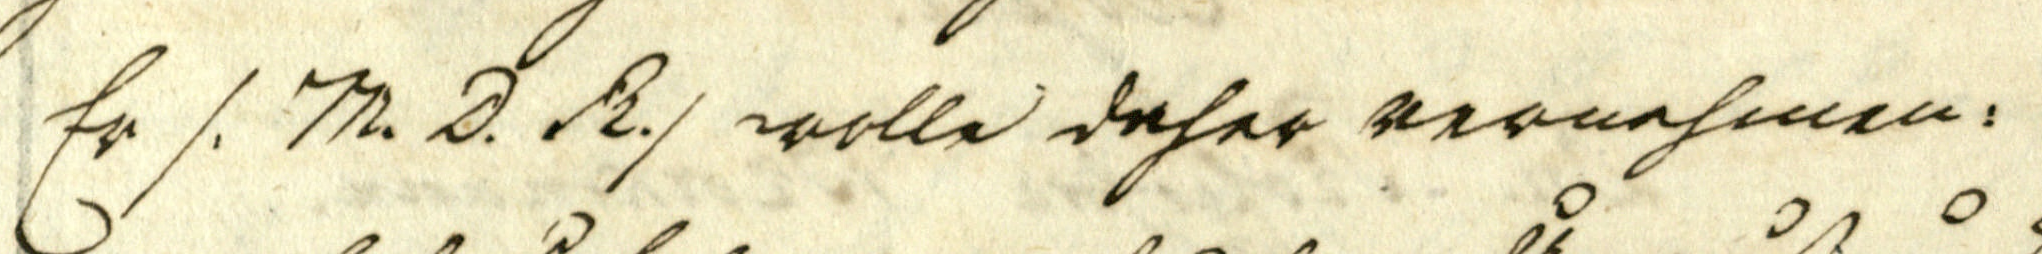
Er /. M. D. R./ wolle daher vernehmen:
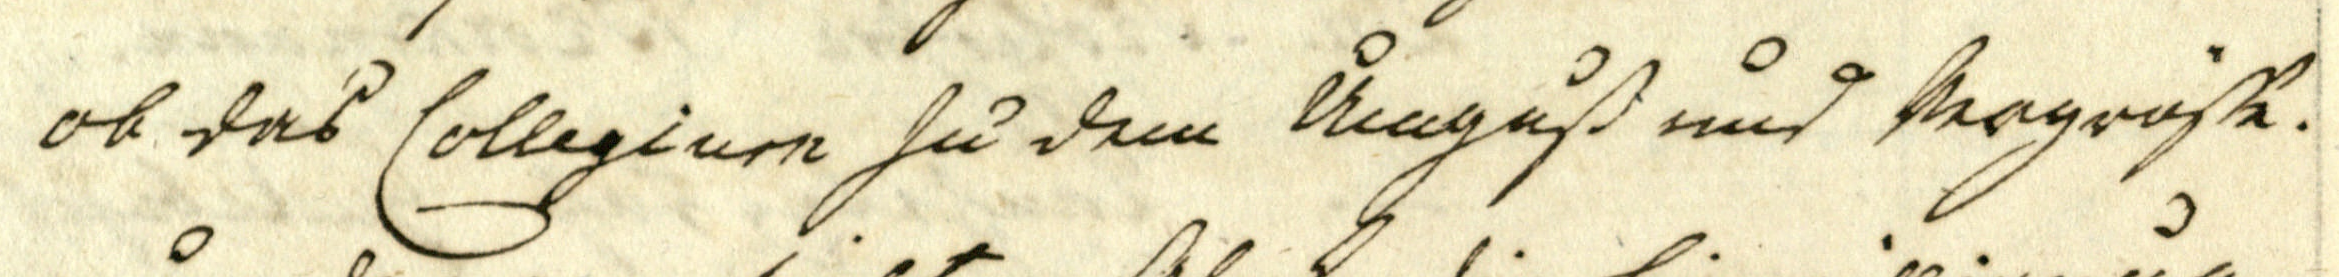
ob das Collegium zu dem Umguß und Vergrösse¬
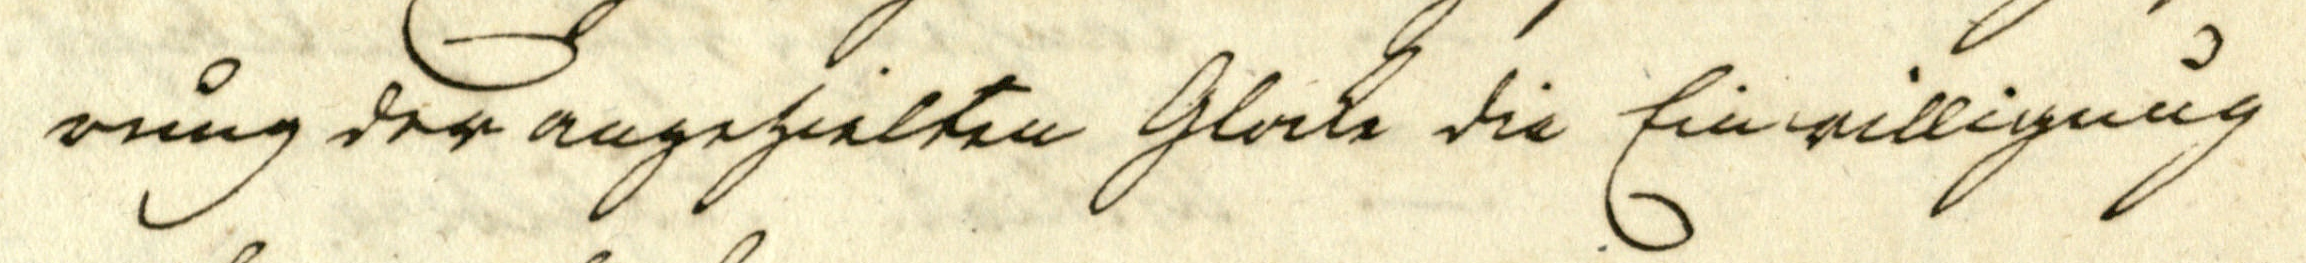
rung der angezielten Glocke die Einwilligung
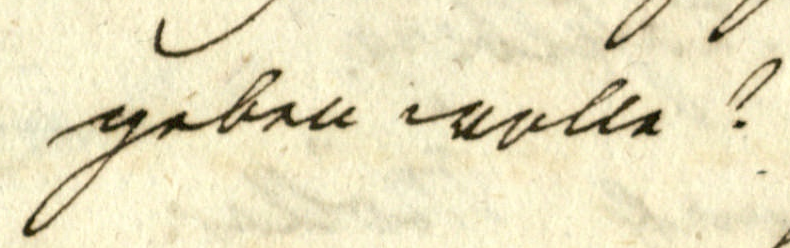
geben wolle?
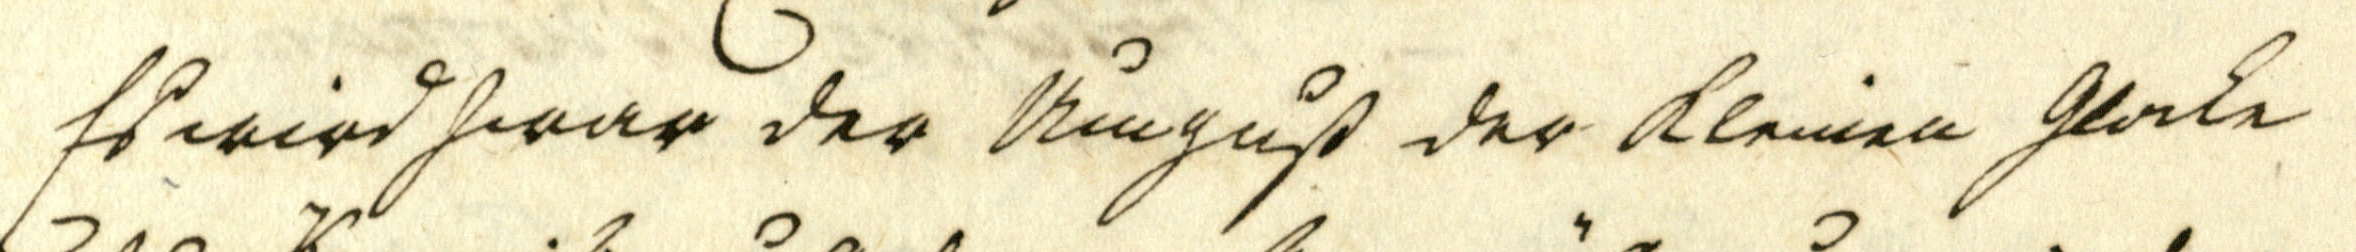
Es wird zwar der Umguß der kleinen Glocke
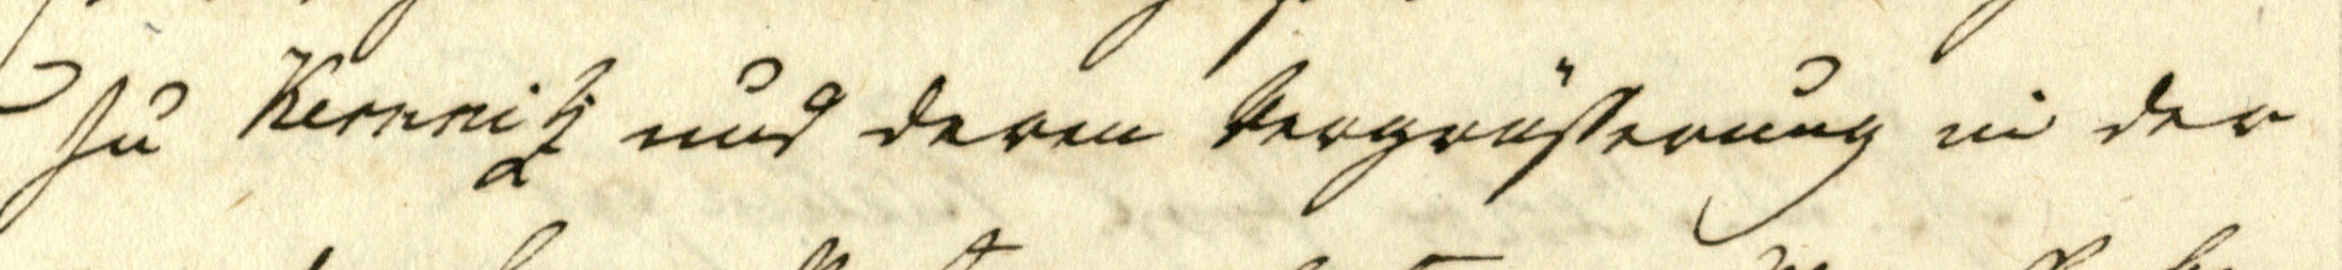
zu Kemnitz und deren Vergrösserung in der
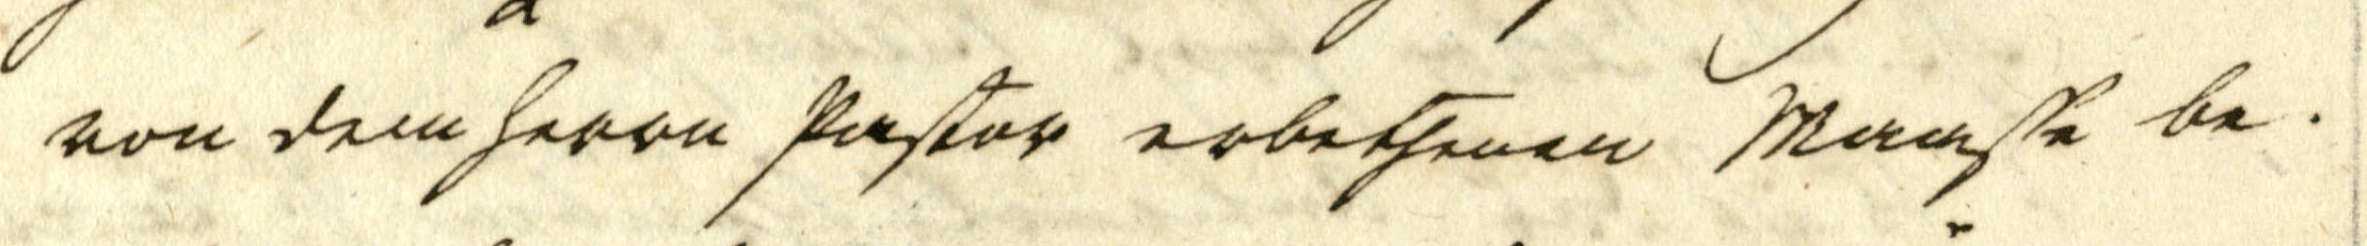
von dem Herrn Pastor erbethenen Maasse be¬
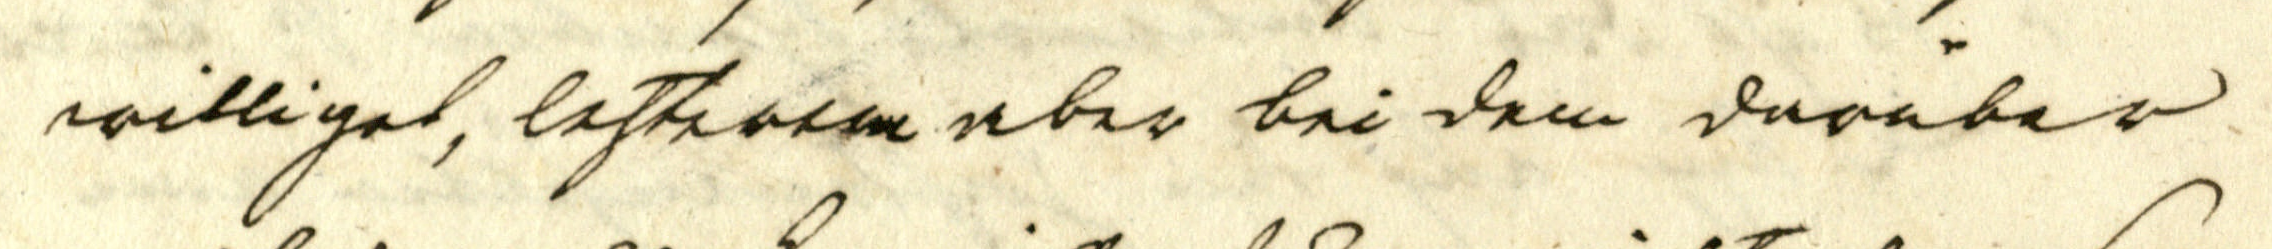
williget, letzterem aber bei dem darüber
